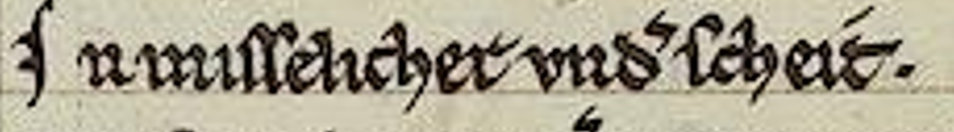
In miſſelicher vnd(er)ſcheit.
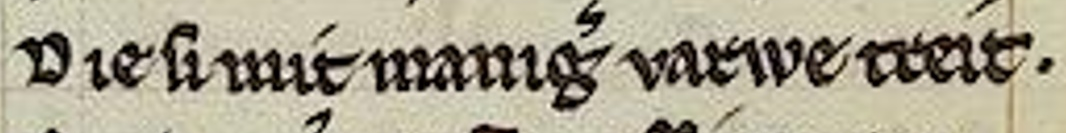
Die ſi mit manig(er) varwe treit.
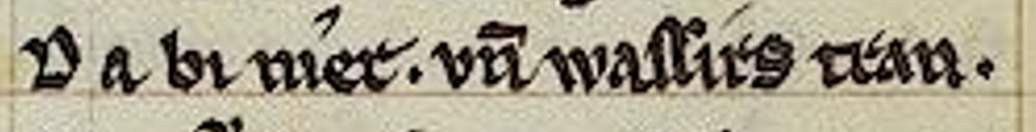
Da bi mer. vn(d) waſſirs tran.
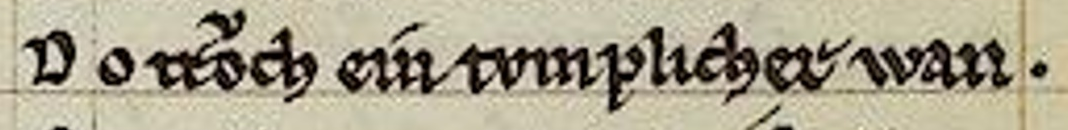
Do tro°vch ein tvmplicher wan.
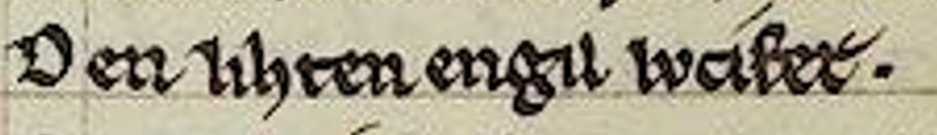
Den lihten engil lvcifer.
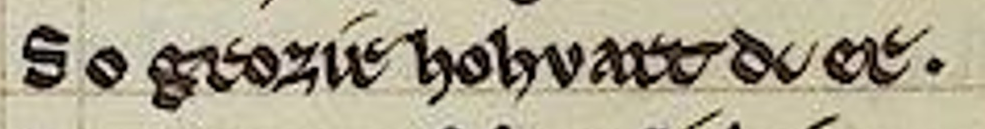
So grozir hohvart d(az) er.
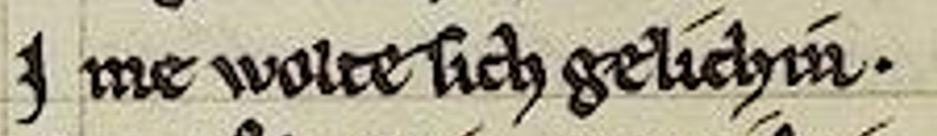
Ime wolte ſich gelichin.
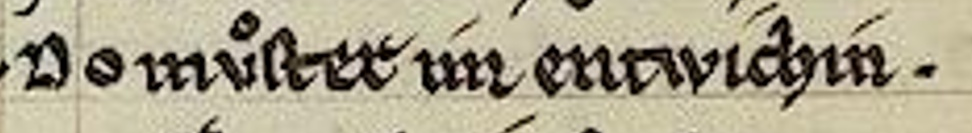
Do mv°oſter im entwichin.
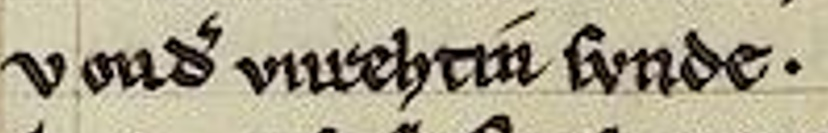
Von d(er) vnrehtin ſvnde.
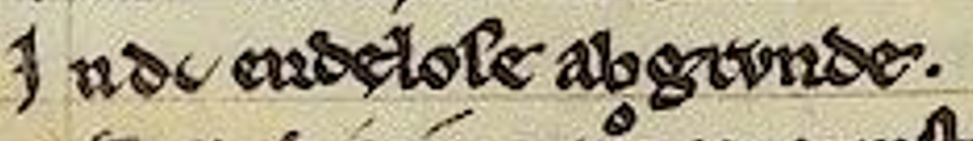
In d(az) endeloſe abgrvnde.
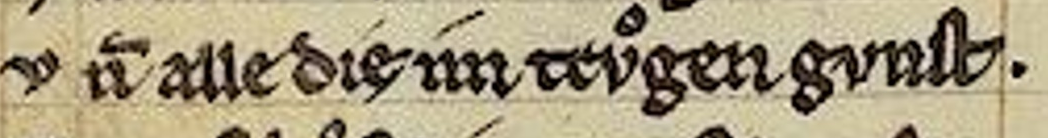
Vn(d) alle die im trv°ogen gvnſt.
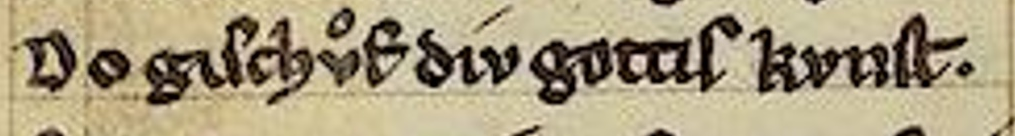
Do giſchv°of div gottiſ kvnſt.
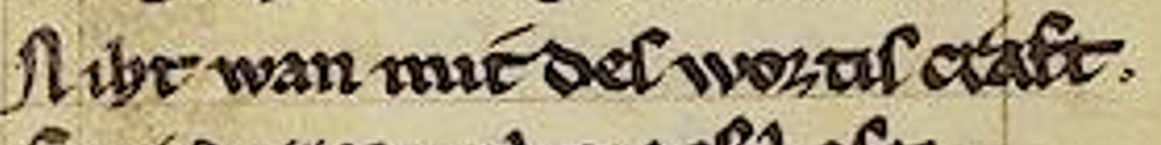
Niht wan mit deſ wortiſ craft.
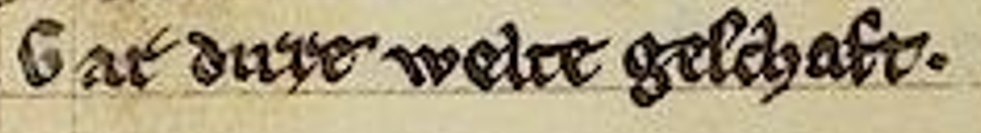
Gar dirre welte geſchaft.
